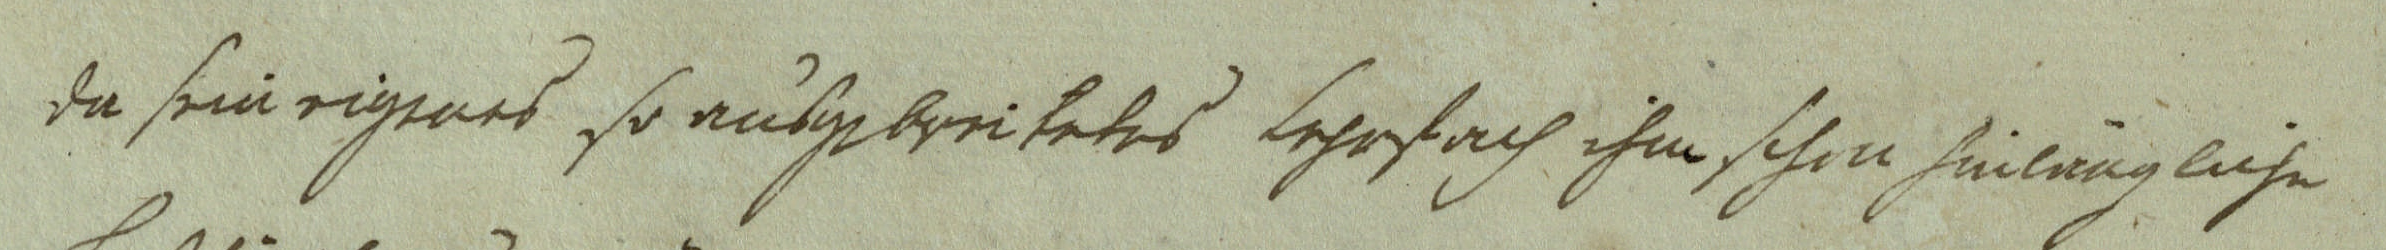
da sein eigenes so ausgebreitetes Lehrfach ihm schon hinlänglich
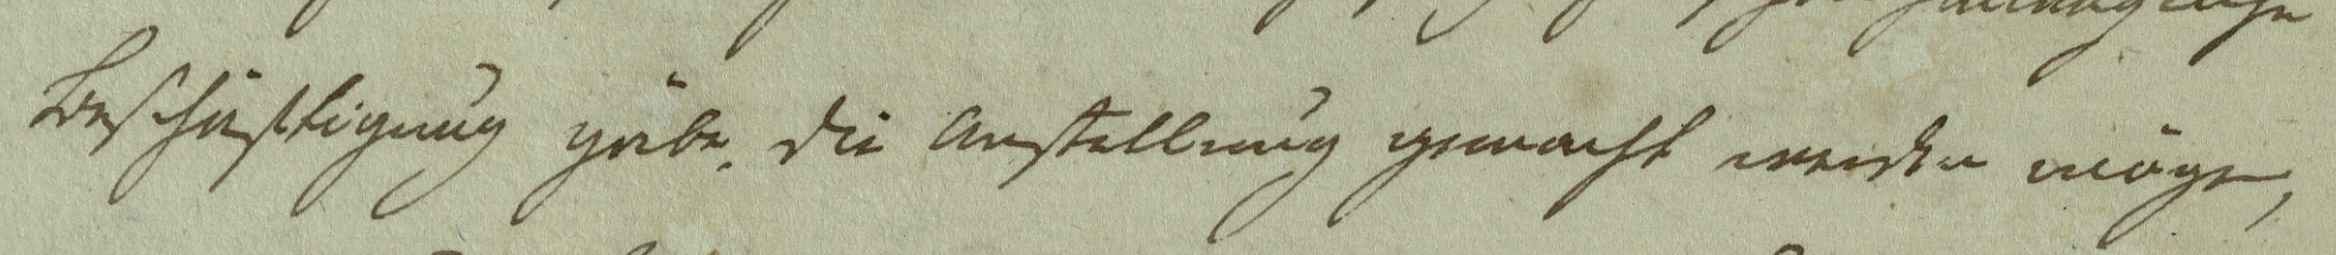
Beschäftigung gäbe, die Anstellung gemacht werden möge,
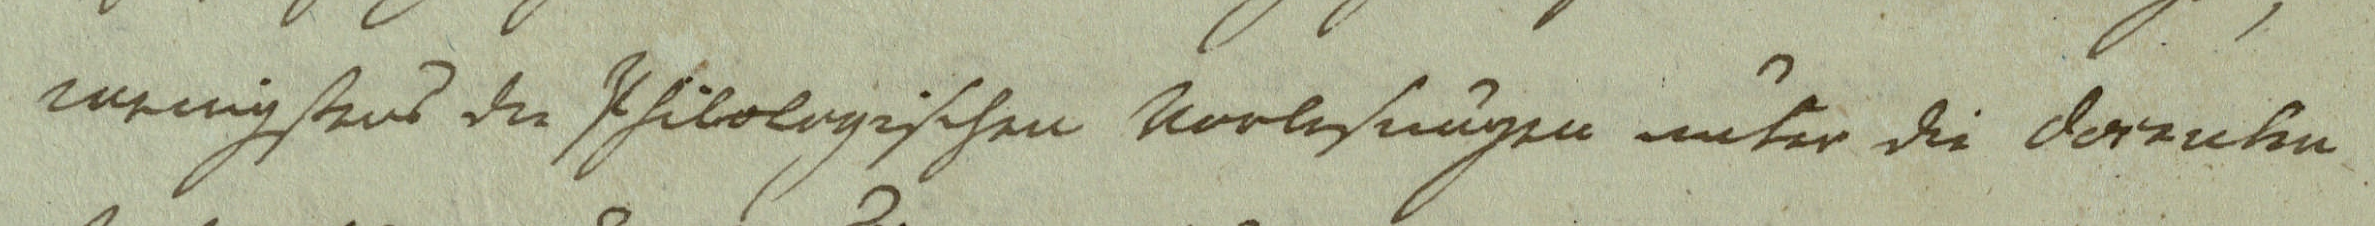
wenigstens die Philologischen Vorlesungen unter die Docenten
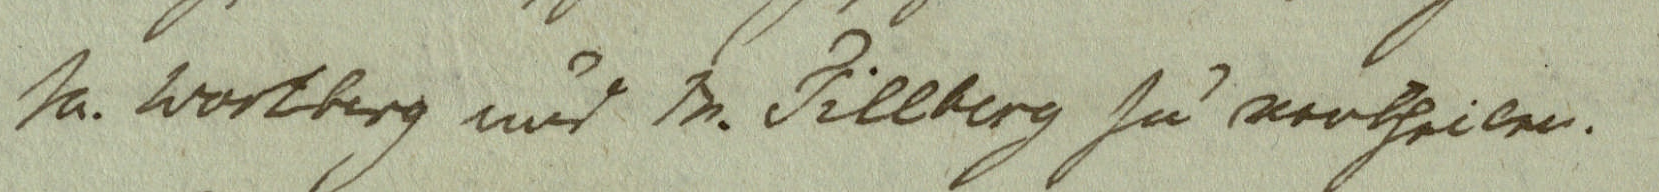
M. Wortberg und M. Tillberg zu vertheilen.
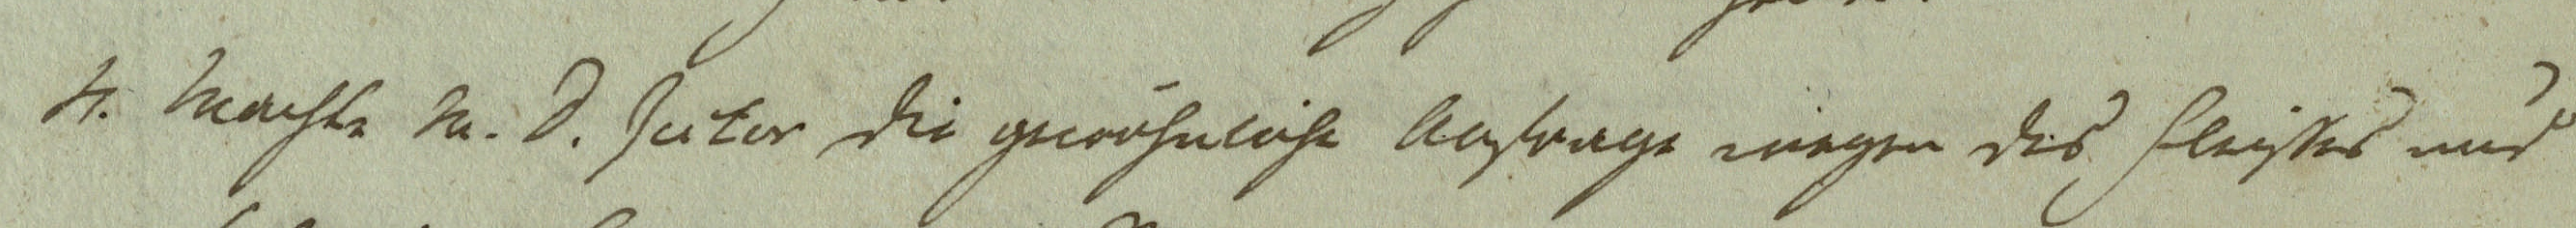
4. Machte M. D. Rector die gewöhnliche Anfrage wegen des Fleisses und
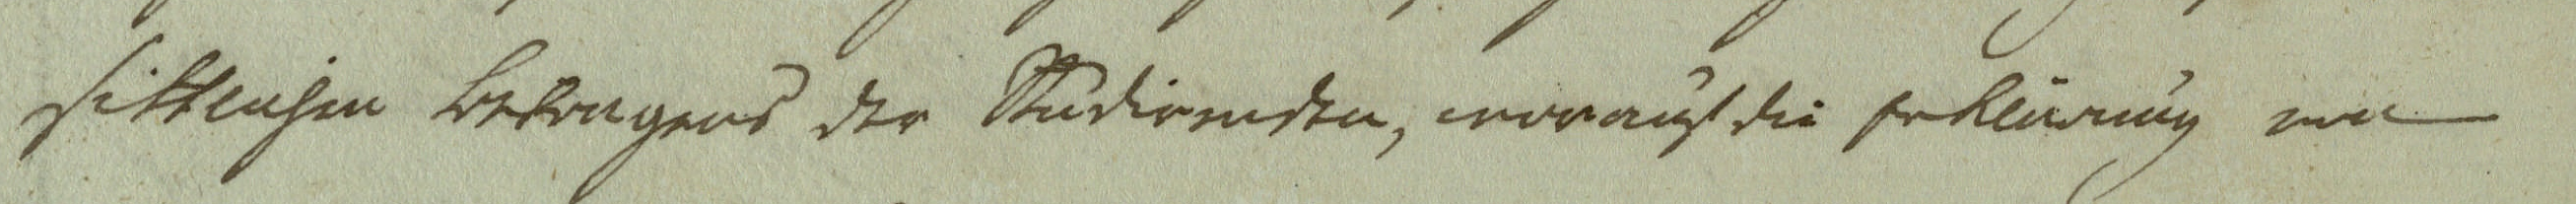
sittlichen Betragens der Studirenden, worauf die Erklärung von
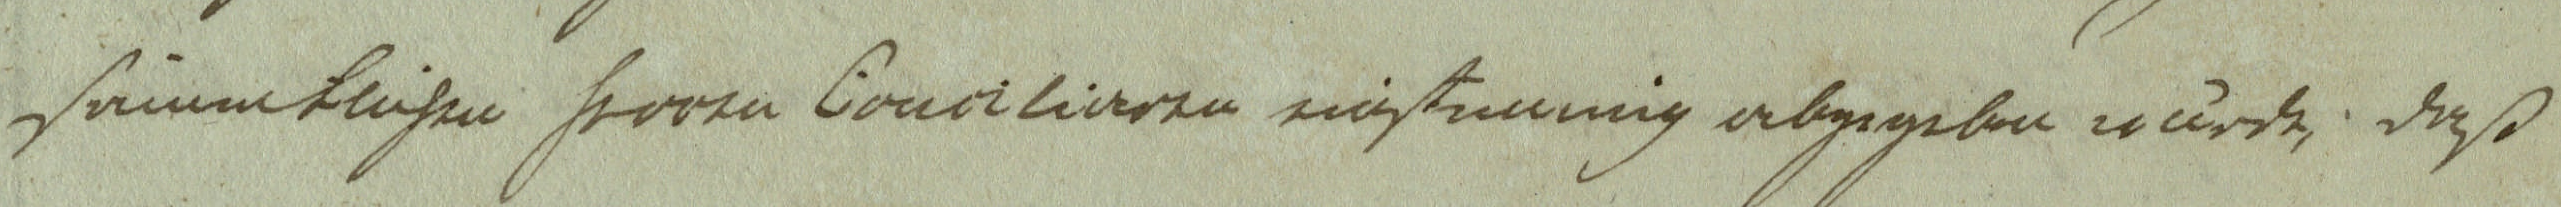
sämmtlichen herren Conciliaren einstimmig abgegeben wurde, daß
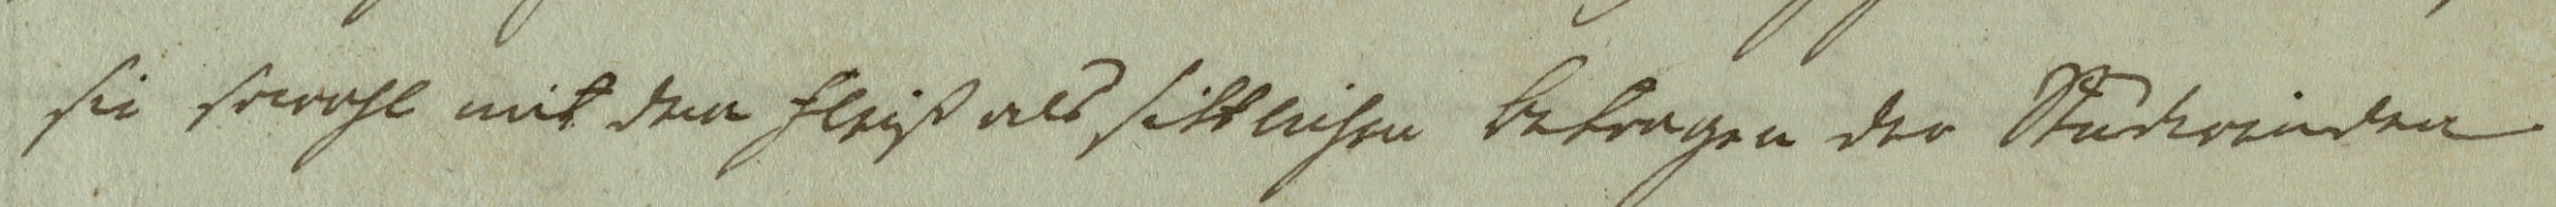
sie sowohl mit dem Fleiß als sittlichen Betragen der Studirenden
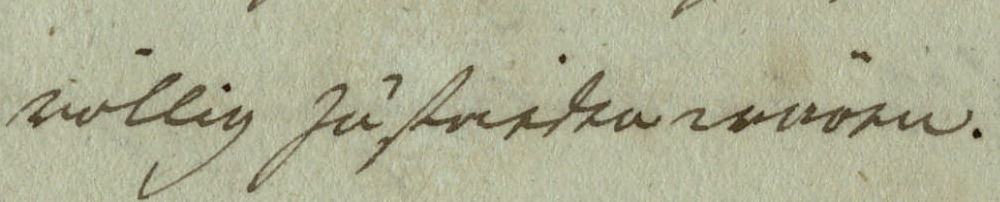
völlig zufrieden wären.
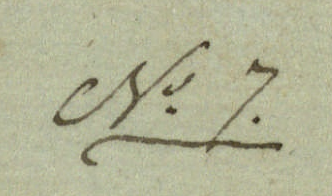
Nº 7.
